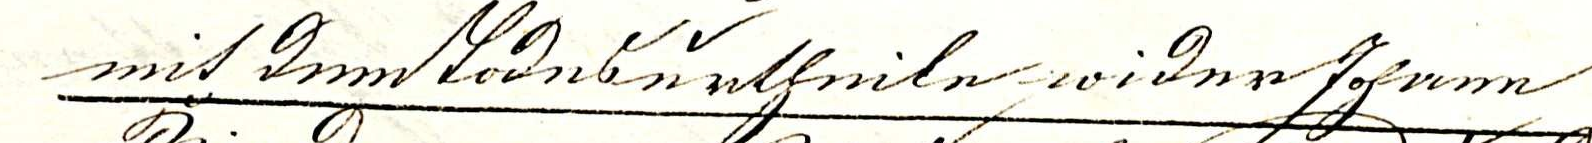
mit dem Todesurtheile wider Johann
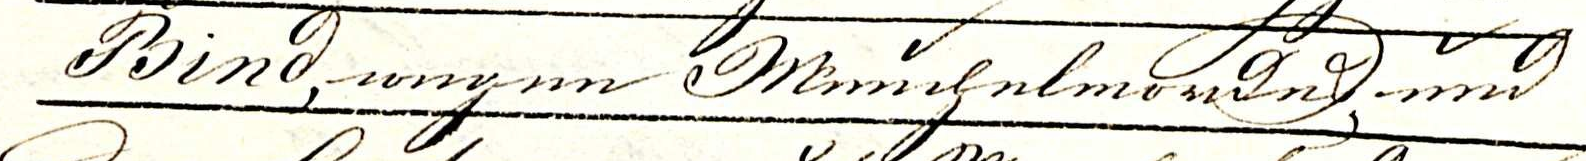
Bind, wegen Meuchelmordes und
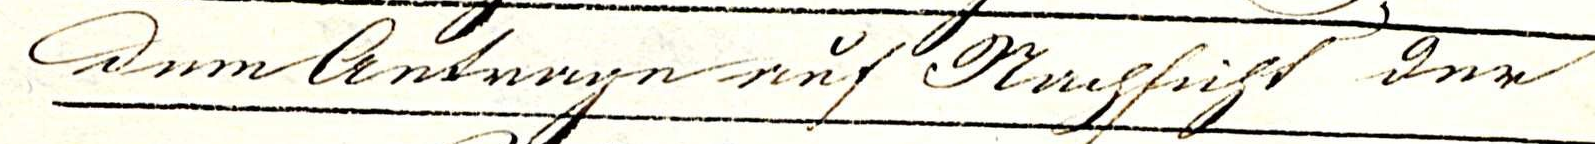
dem Antrage auf Nachsicht der
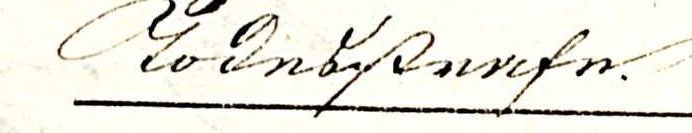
Todesstrafe.
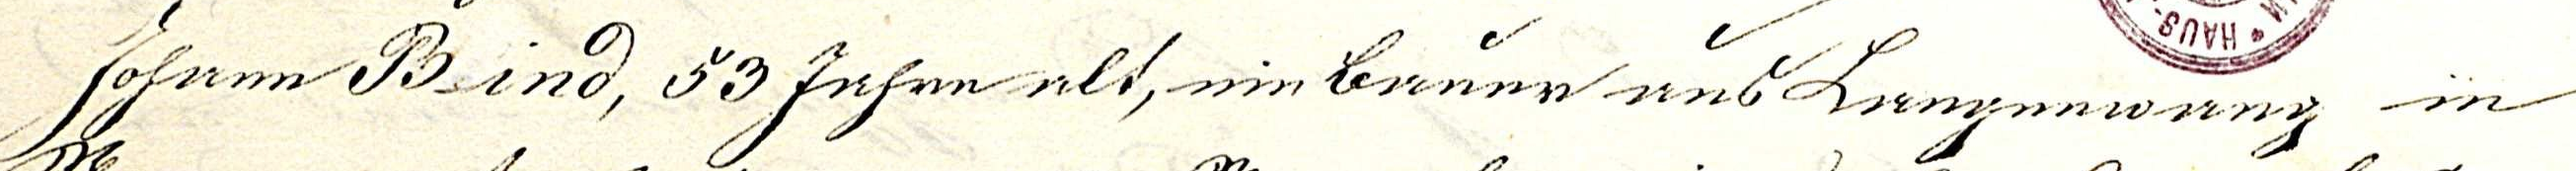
Johann Bind, 53 Jahre alt, ein Bauer aus Langenwang in
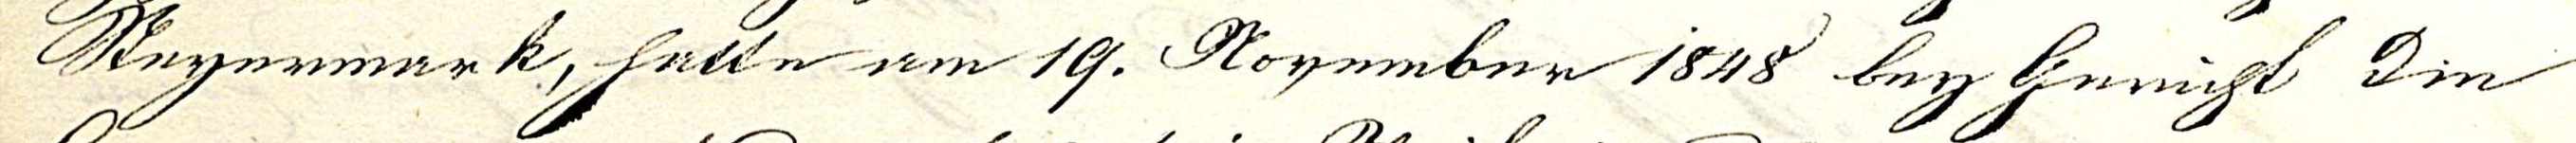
Steyermark, hatte am 19. November 1848 bey Gericht die
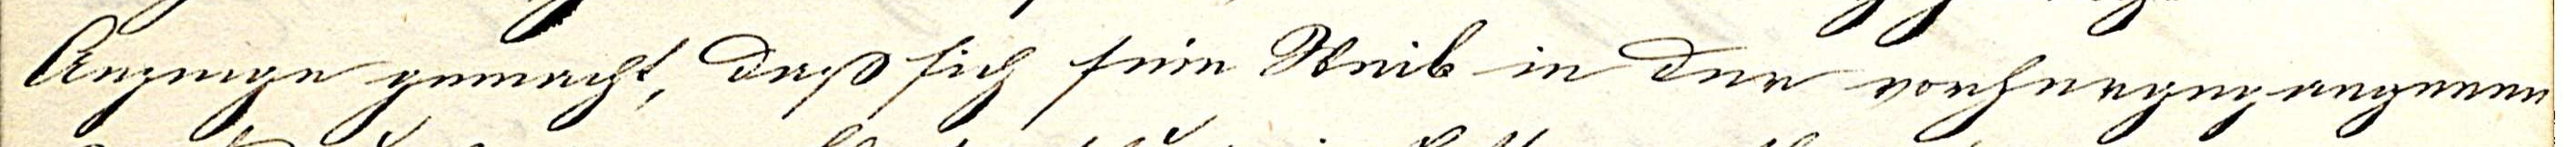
Anzeige gemacht, daß sich sein Weib in der vorhergegangenen
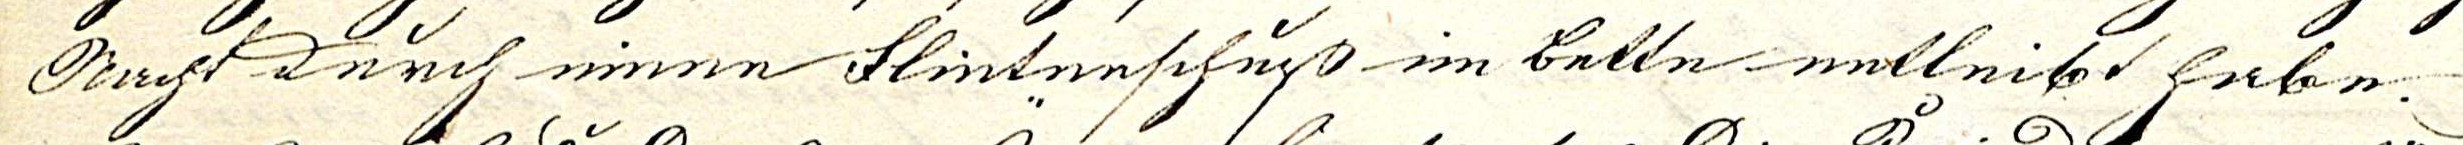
Nacht durch einen Flintenschuß im Bette entleibt habe.
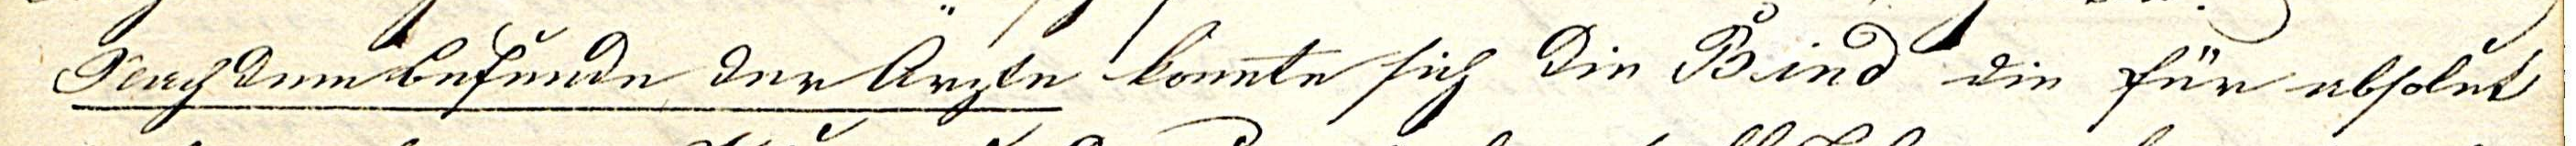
Nach dem Befunde der Ärzte konnte sich die Bind die für absolut
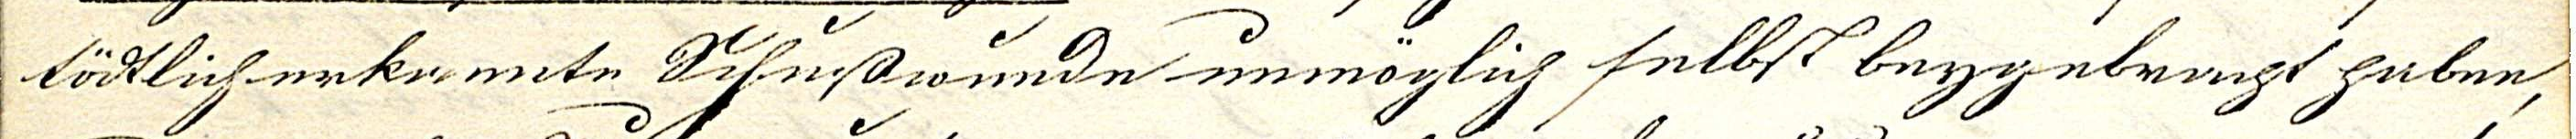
tödtlich erkannte Schußwunde unmöglich selbst beygebracht haben,
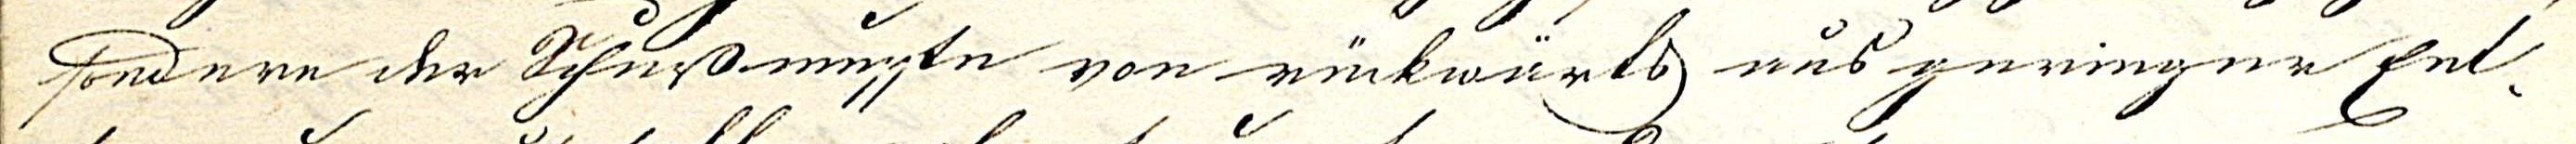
sondere der Schußmusste von rückwärts aus geringer Ent¬
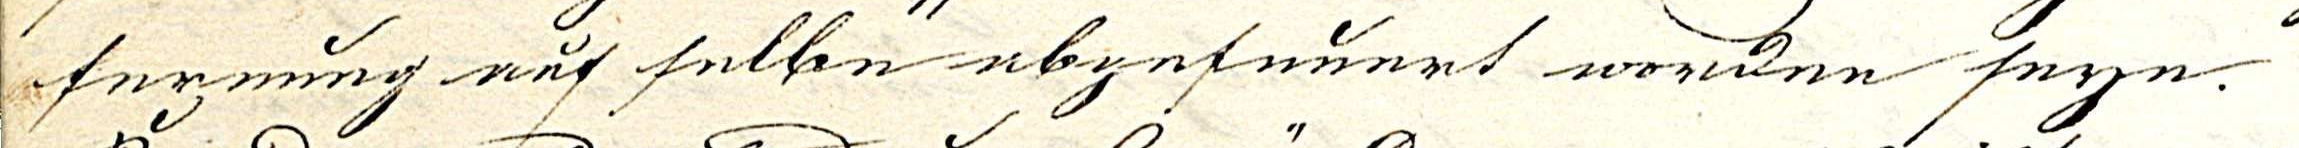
fernung auf selbe abgefeuert worden seye.
